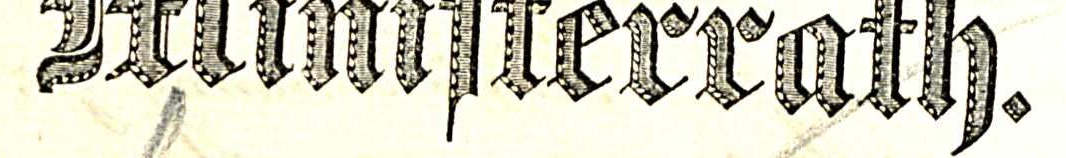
Ministerrath
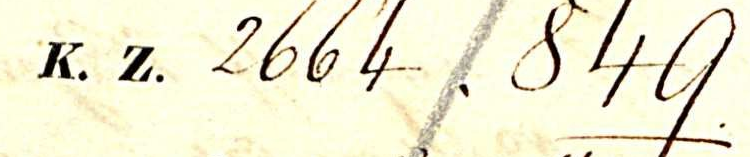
KZ 2664 [1]849
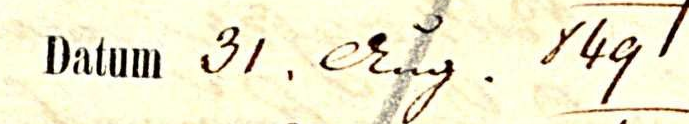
Datum 31. Aug. 1849
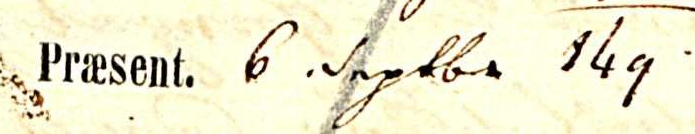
Praesent 6. Sept. [1]849
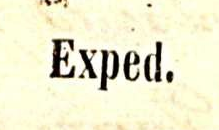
Exped.
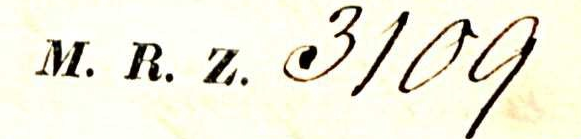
MRZ 3109
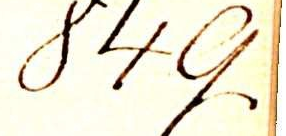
849
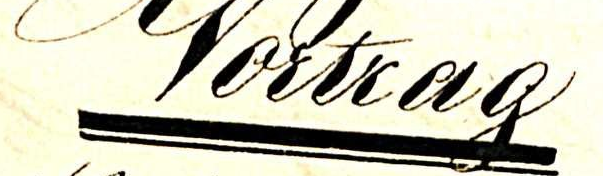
Vortrag
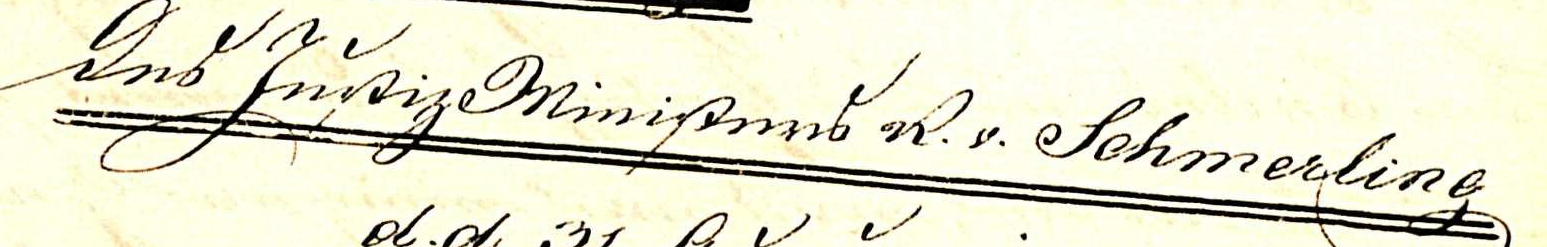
des Justiz-Ministers R. v. Schmerling
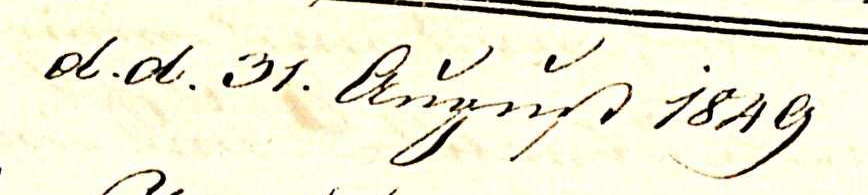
dd. 31 August 1849
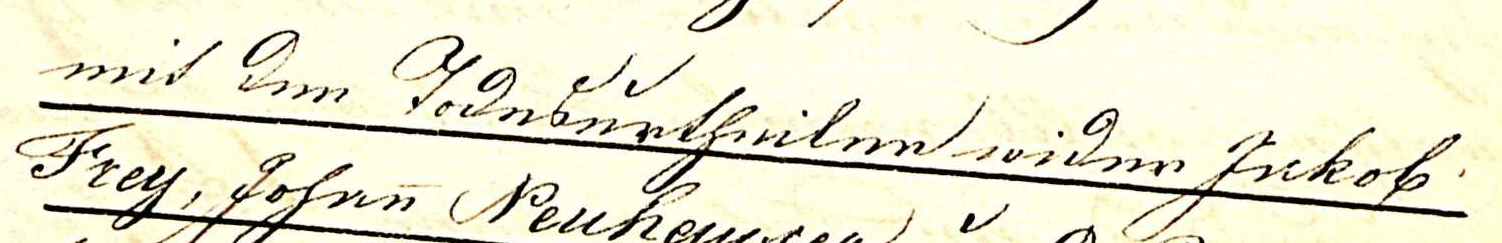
mit dem Todesurtheilen wider Jakob
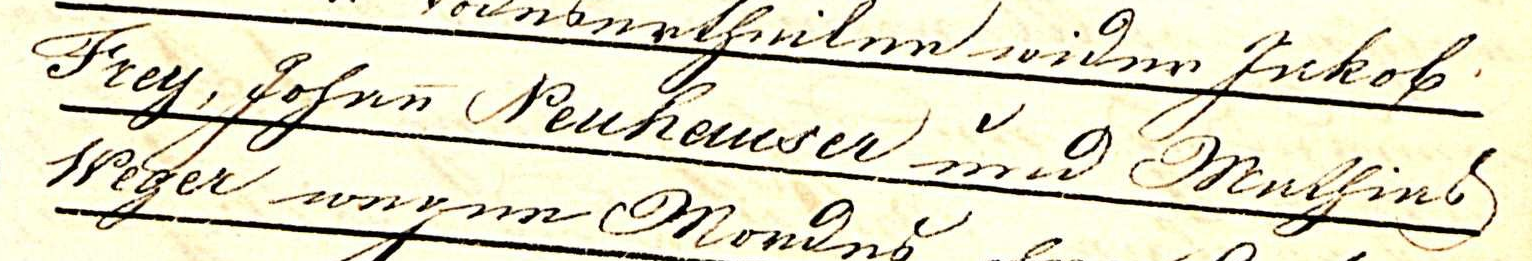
Frey, Johann Neuhauser und Mathias
